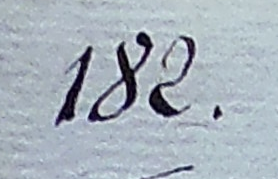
182.
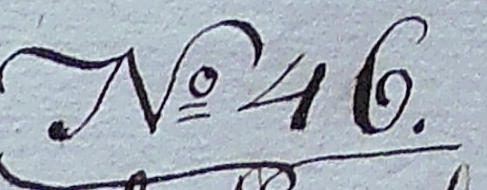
No͇ 46.
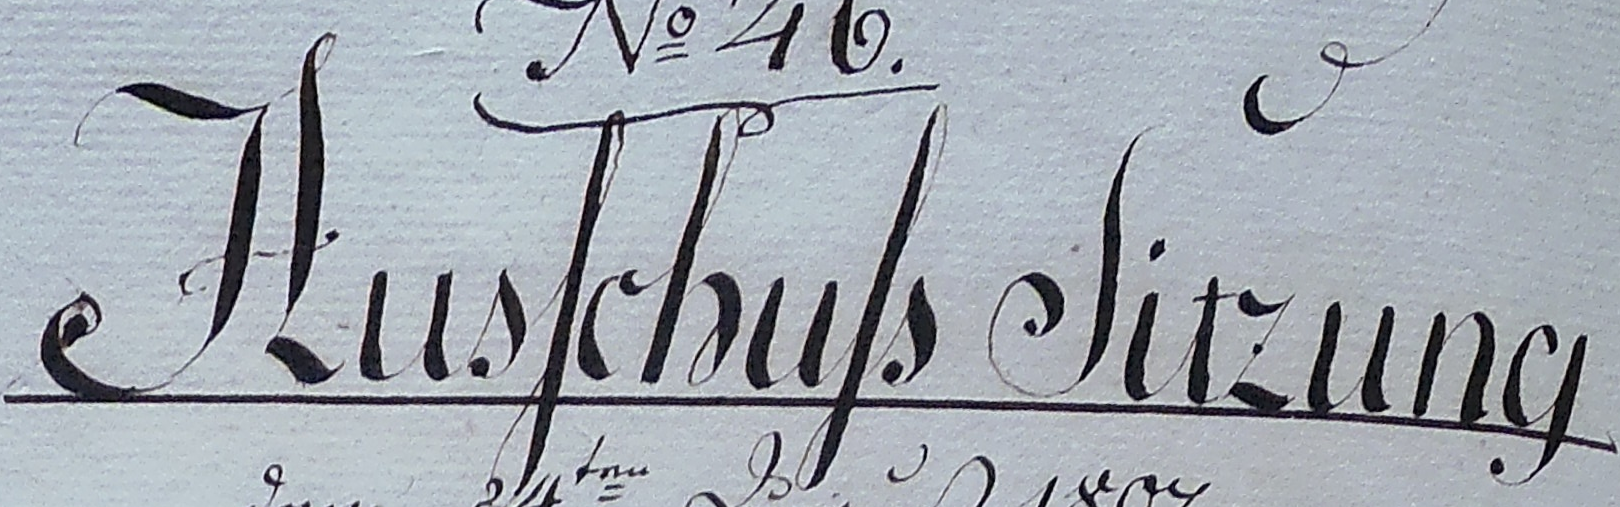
Ausschuss Sitzung
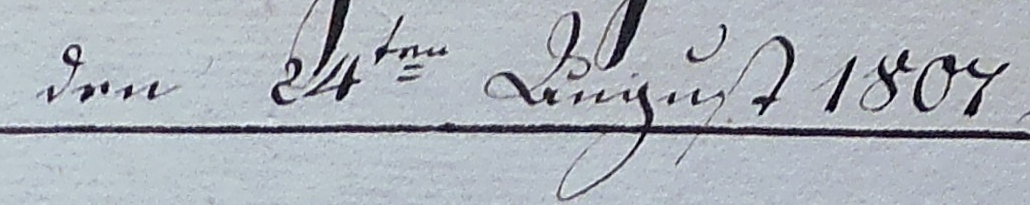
den 24te͇n August 1807
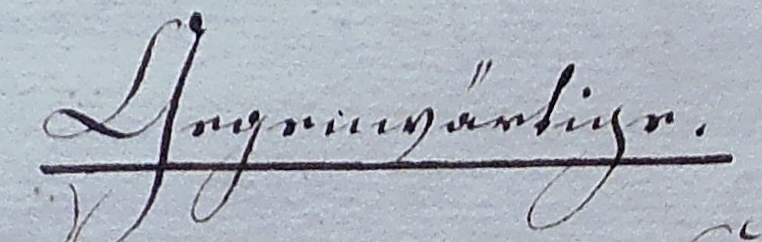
Gegenwärtige.
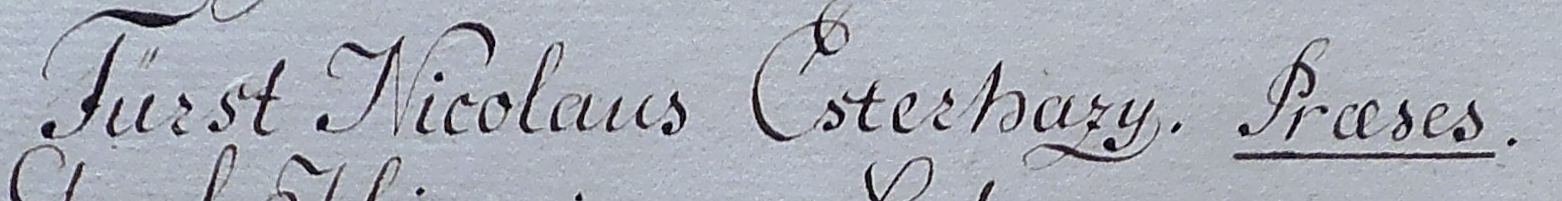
Fürst Nicolaus Esterhazy. Præses.
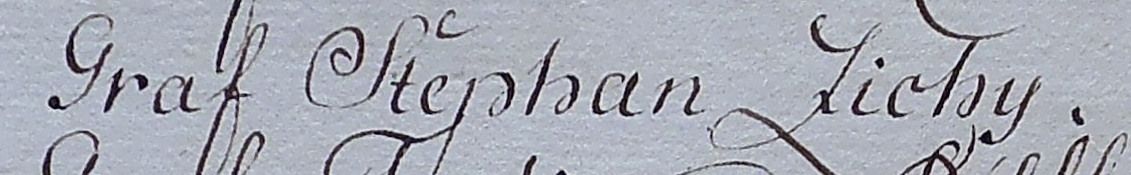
Graf Stephan Zichy.
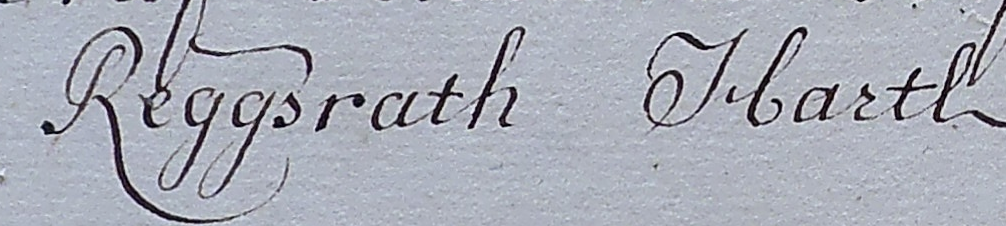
Reg͞gsrath Hartl
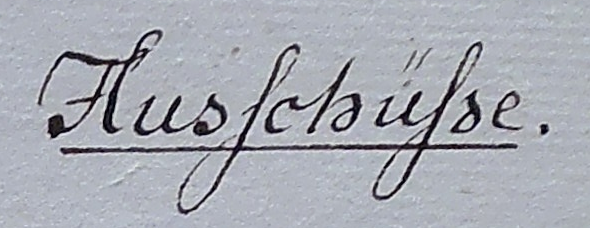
Ausschüsse.
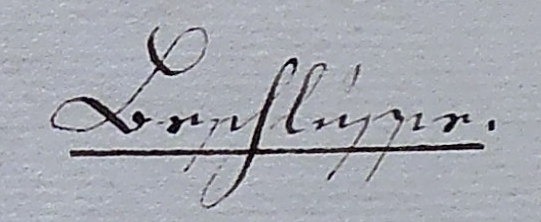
Beschlüsse.
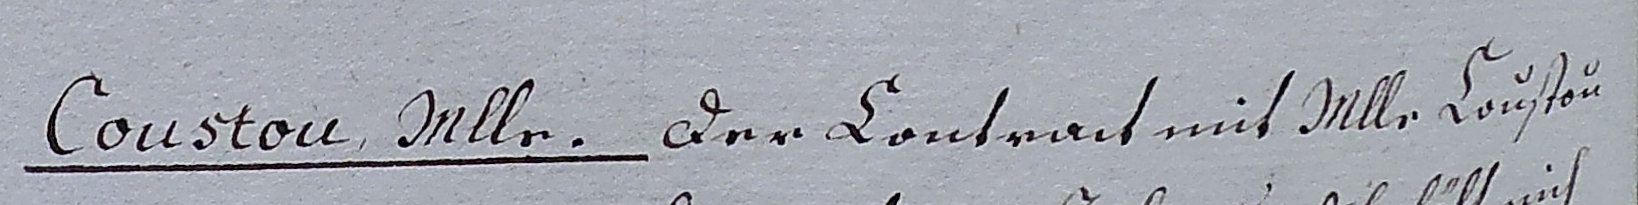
Coustou, Mlle. Der Contract mit Mlle Coustou
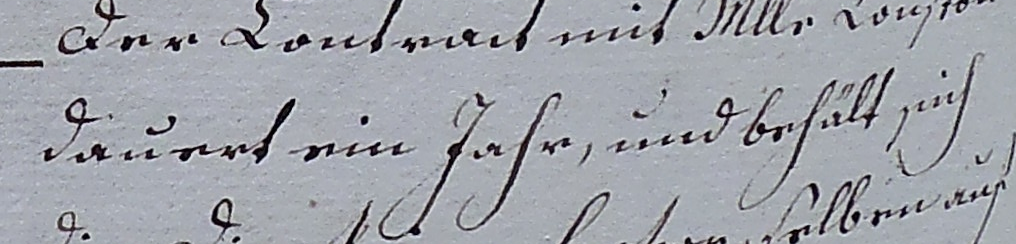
dauert ein Jahr, und behält sich
